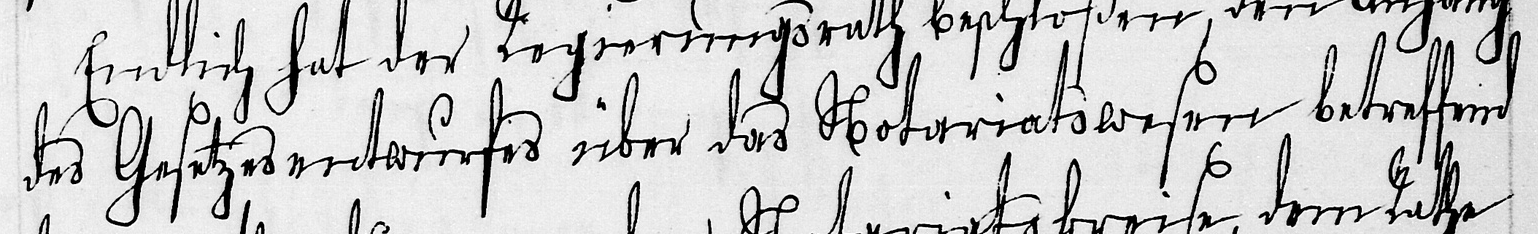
des Gesetzesentwurfes über das Notariatswesen betreffend
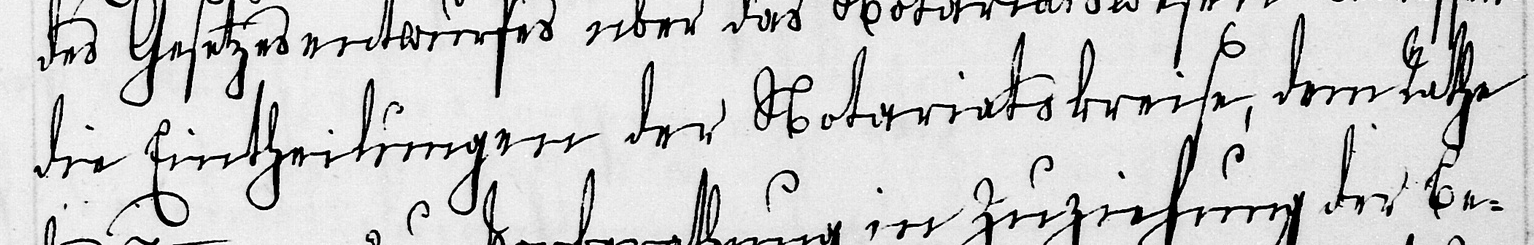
die Eintheilungen der Notariatskreise, dem Rathe
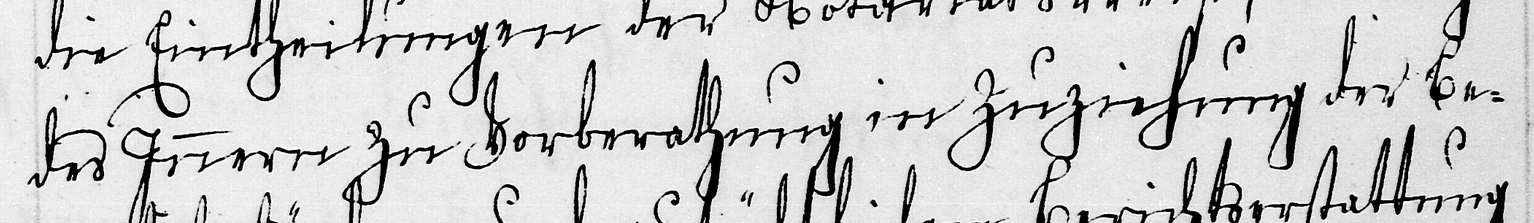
des Innern zu Vorberathung in Zuziehung der Be¬
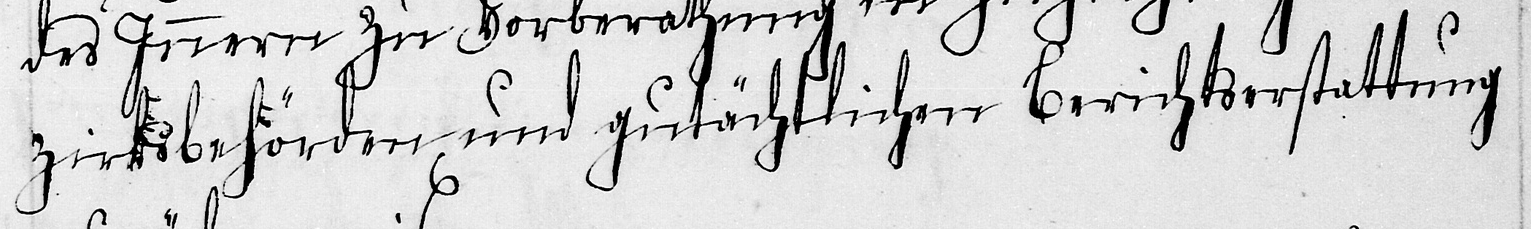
zirksbehörden und gutächtlichen Berichtserstattung
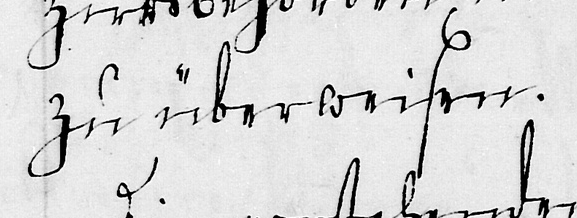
zu überweisen.
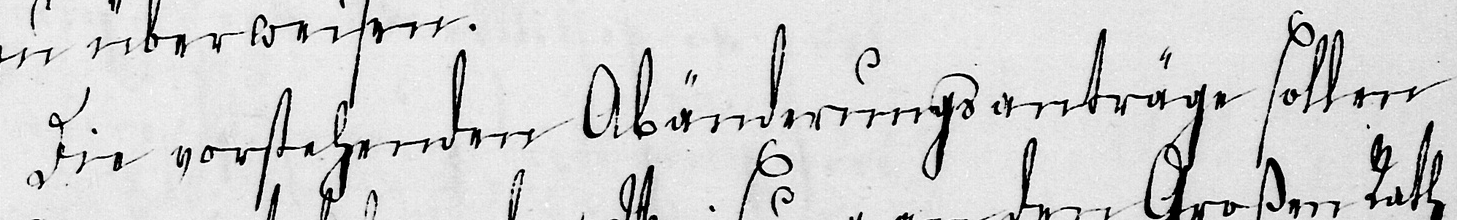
Die vorstehenden Abänderungsanträge sollen
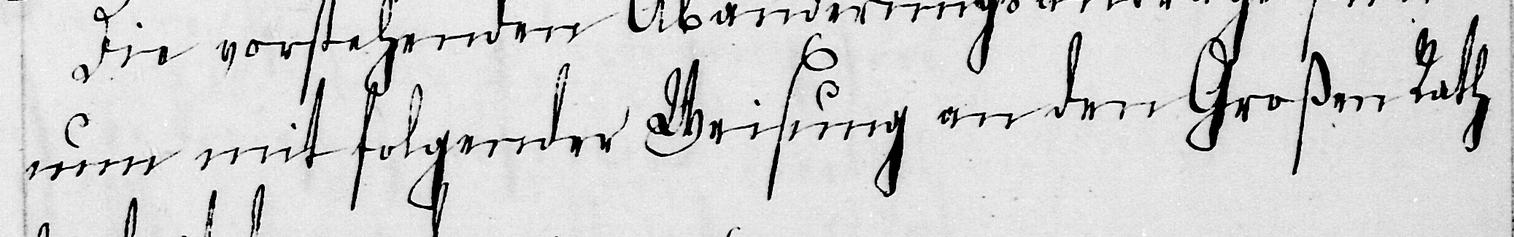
nun mit folgender Weisung an den Großen Rath
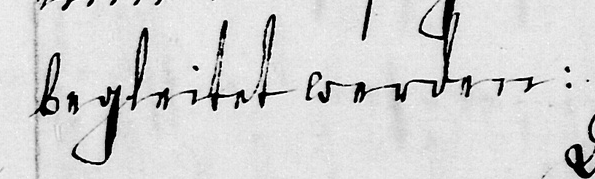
begleitet werden:
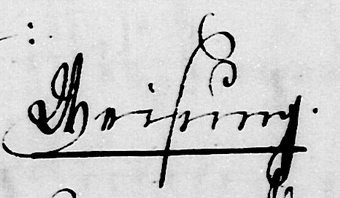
Weisung.
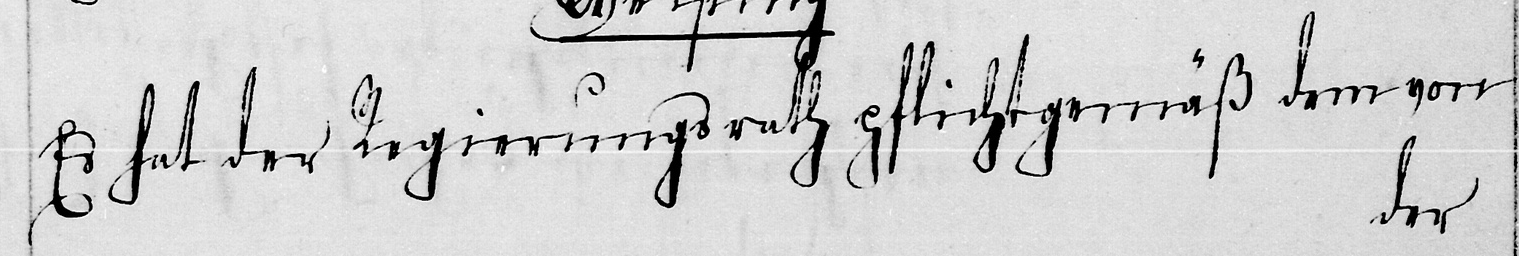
Es hat der Regierungsrath pflichtgemäß dem von
